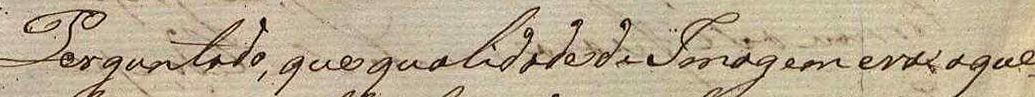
Perguntado, que qualidade de Imagem era aque
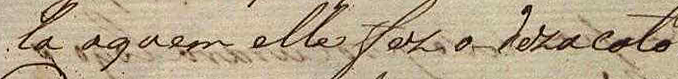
la a quem elle fez o dezacato.
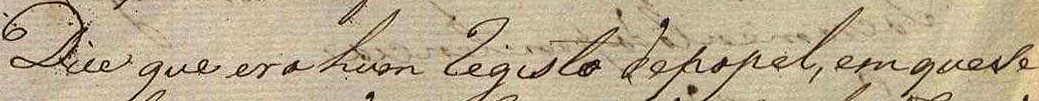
Disse que era hum Registo de papel, em que se
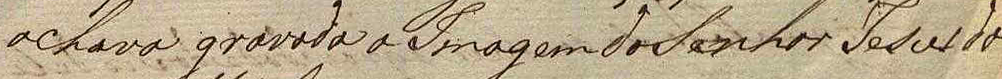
achava gravada a Imagem do Senhor Iesus da
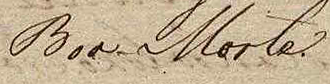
Boa Morte.
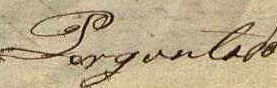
Perguntado
